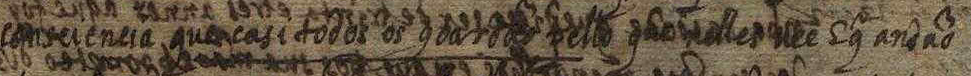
consciencia que casi todos os goardaõ pello que nelles uee E q̄ andaõ
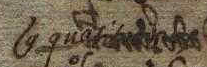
q̄ quasi todos os
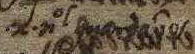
.x. nos guardão os
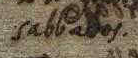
sabbados.
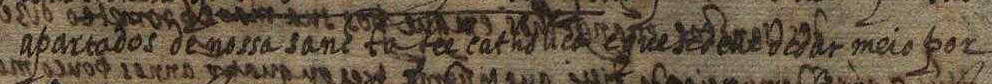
apartados de nossa sancta fee catholica e que se deue de dar meio por
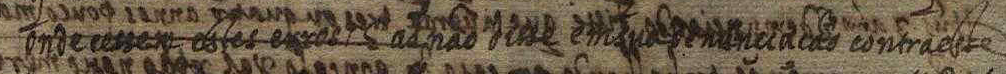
onde cessem estes erros / E al não disse em sua denunciação contra este
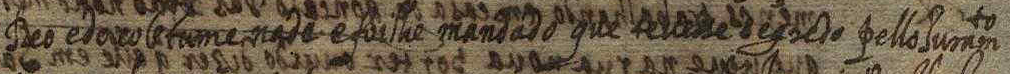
Reo e do costume nada e foilhe mandado que teuesse segredo pello Iuramto
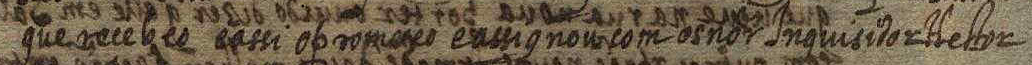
que recebeo e assi o prometeo e assignou com o snōr Inquisidor Hector
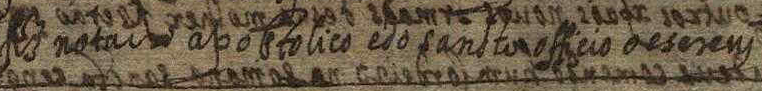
frz̄ notairo apostolico e do sancto officio o escreuj
